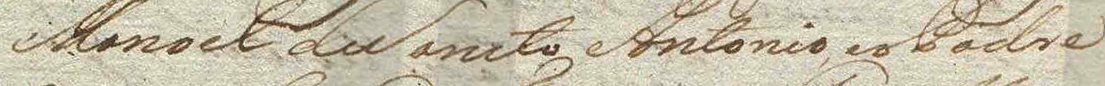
Manoel de Sancto Antonio, e o Padre
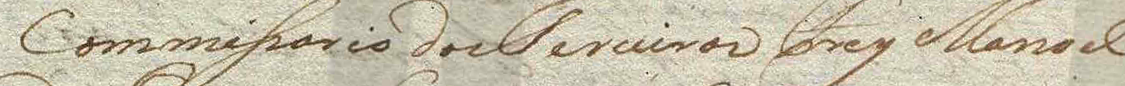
Commissario dos Terceiros Frey Manoel
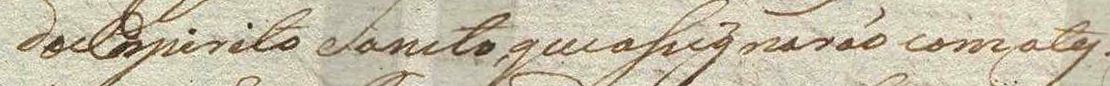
do Espirito Sancto, que assignaraõ com a tes
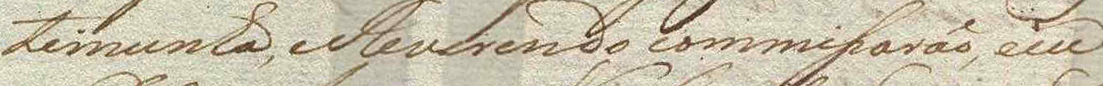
timunha, e Reverendo commissaraõ, e eu
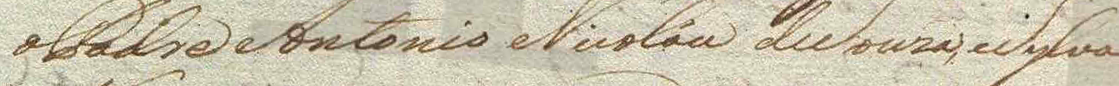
o Padre Antonio Nicoláu de Souza, e Sylva
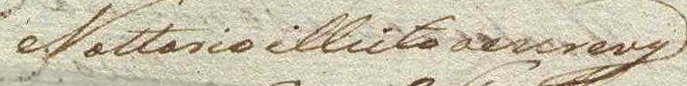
Nottario illeito o escrevy
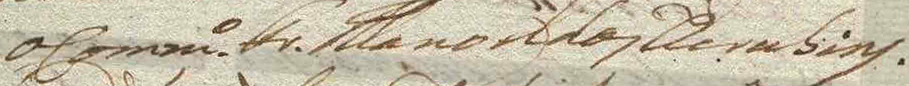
O Comm.o Fr. Manoel dos Cherubins.
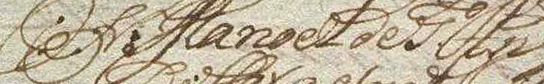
Pe fr. Manoel de S.to Anto
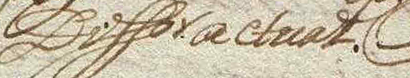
Diffor actual
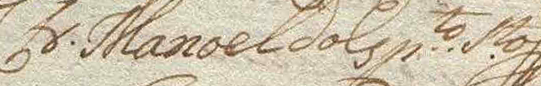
Fr. Manoel do Esp.to S.to
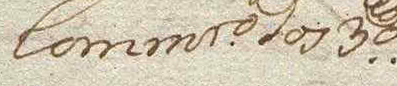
Commr.o dos 3.os
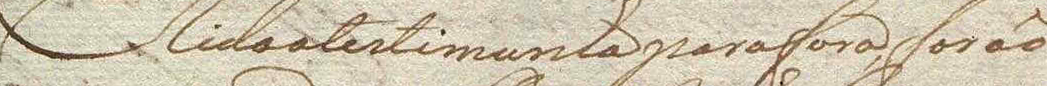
E hida a testimunha para fora foraõ
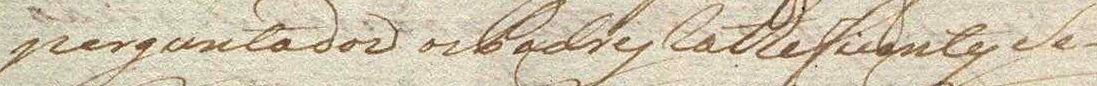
perguntados os Padres Ratheficantes Se
